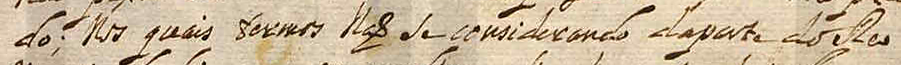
do; Nos quais termos Naõ se considerando da parte do Reo
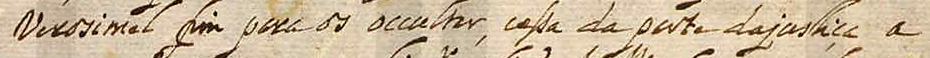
verosimel fim para os occultar, cessa da parte da justiça a
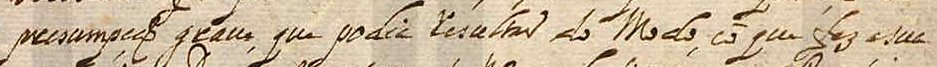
presumpçaõ graue, que podia resultar do Modo, cō que fez a sua
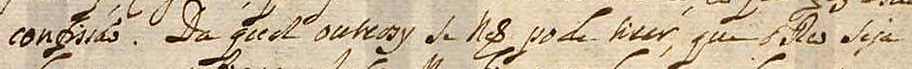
confissaõ. Da qual outrosy se naõ pode tirar, que o Reo seja
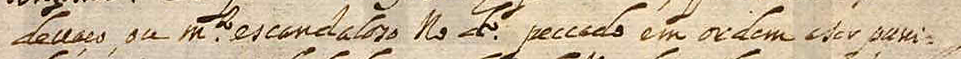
deuaço, ou m.to escandaloso No d.o peccado em ordem a ser puni
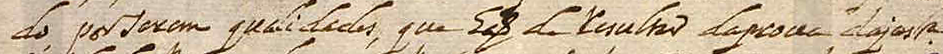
do, por serem qualidades, que haõ de resultar da proua da just.a
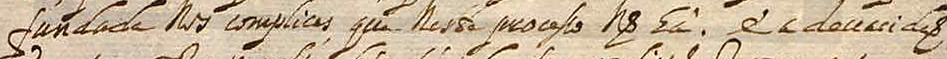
fundada Nos complices, que Neste processo Naõ há. e a deuacidaõ
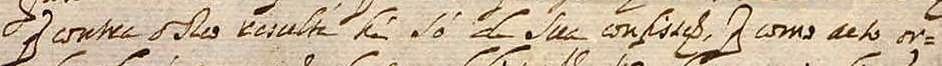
q̄ contra o Reo resulta hé só de sua confissaõ, q̄ como acto or
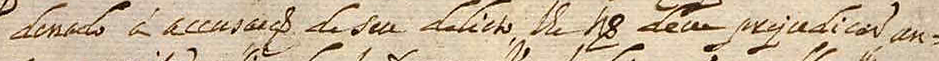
denado á accusaçaõ de seu delicto, lhe nꝭ deue prejudicar, an
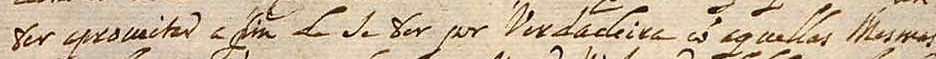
tes aproueitar a fim de se ter por Verdadeira cō aquellas Mesmas
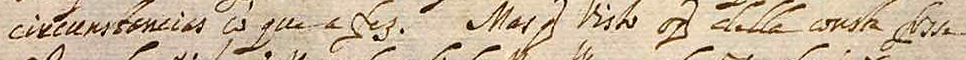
circunstancias cō que a fez. Mas q̄ Visto o q̄ della consta fosse
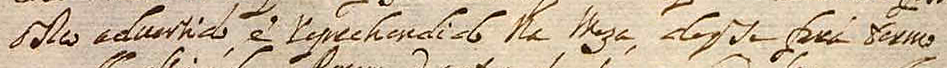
o Reo aduertido, e reprehendido Na Meza, de q̄ se fará termo
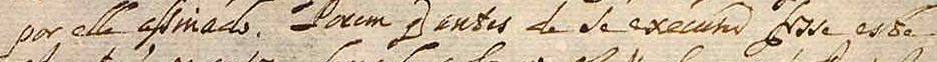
por elle assinado. Porem q̄ antes de se executar fosse este
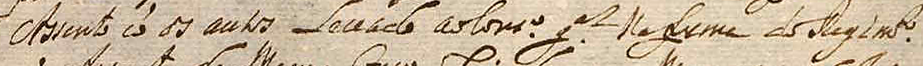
Assento cō os autos Leuado ao Cons.o g.al Na forma do Regim.to
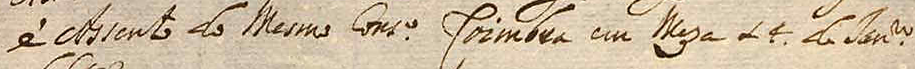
e Assento do Mesmo Cons.o Coimbra em Meza 14 de Ian.ro
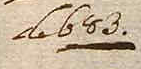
de 683.
